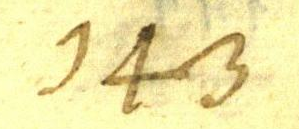143
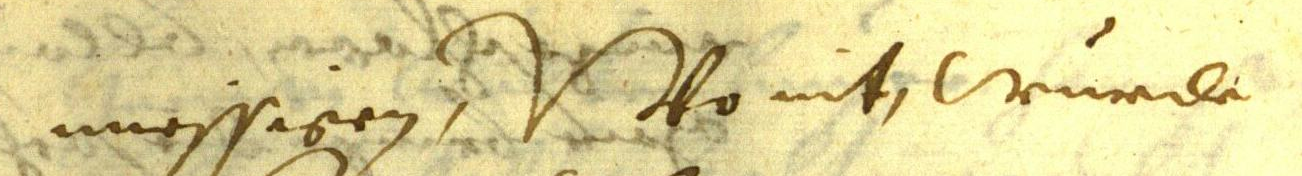miessigen, Wo nit, wūrde
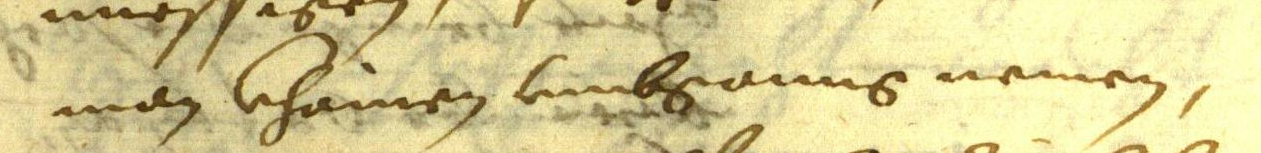man khainen vmbganng nemen,
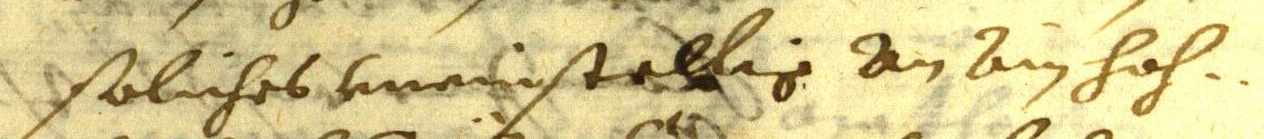soliches vneinstellig An Ain hoh¬
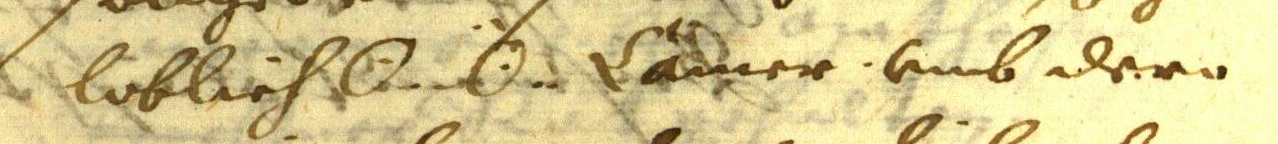loblich O.. Ö.. Camer. vmb dero
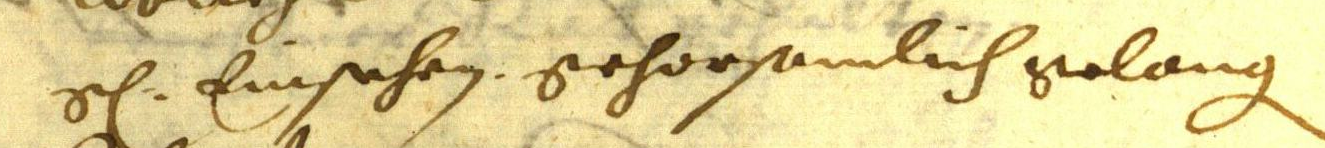g: Einsehen. gehorsamlich gelang
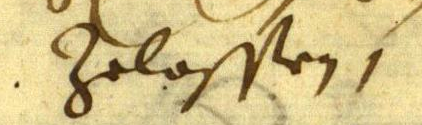Zelassen,
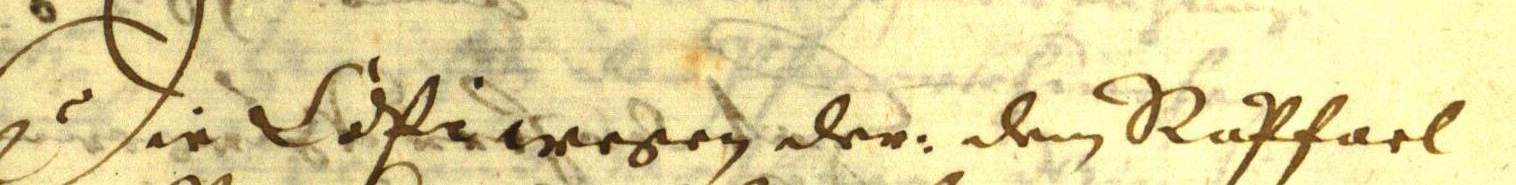Die CoPi wegen der: dem RaPfael
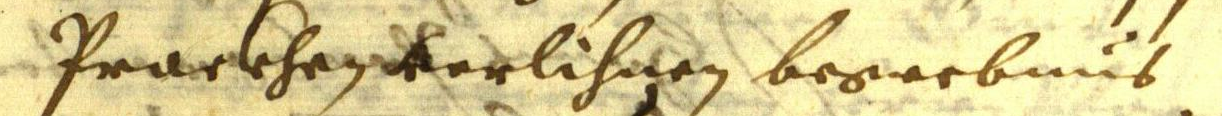Prackhen verlihnen begrebnūs
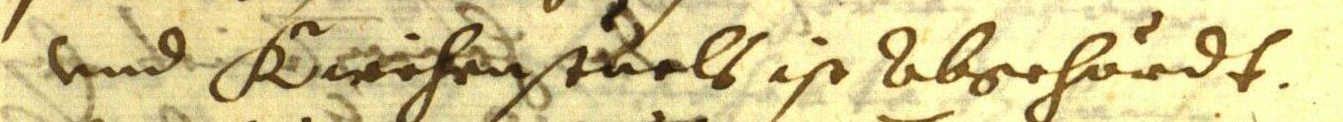vnd Kirchenstūels ist Abgehōrdt.
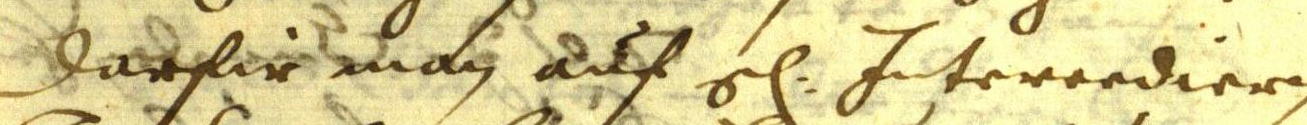darfir man aūf g: Intercediern
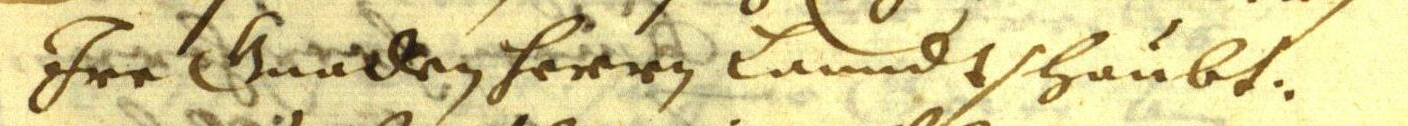Ire Gnaden herrn Lanndtshaūbt¬
